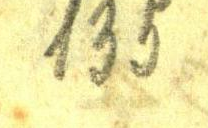135
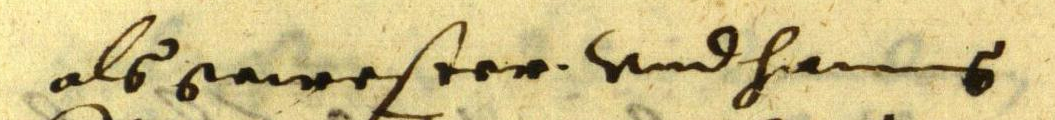als gewester. vnd Hanns
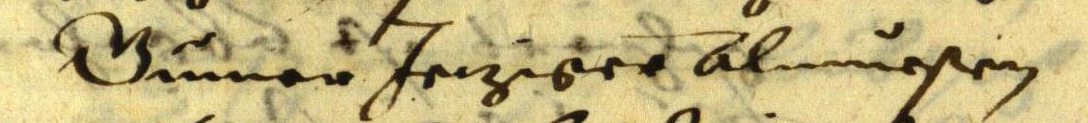Gūmer Jezige Almūesen
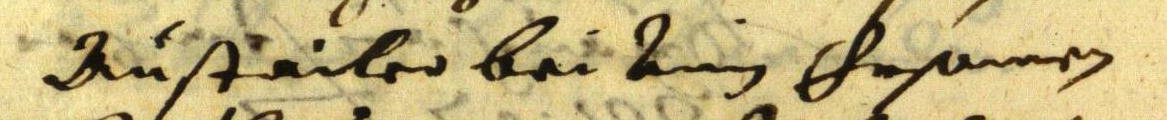Aūstailer bei Aim Ersamen
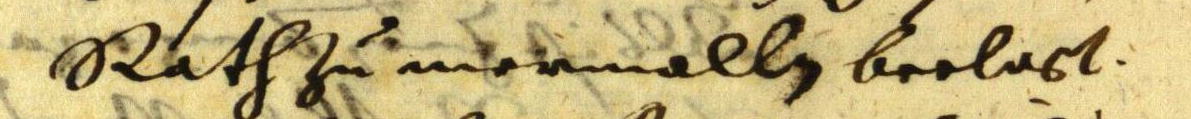Rath Zū mermalln beclagt.
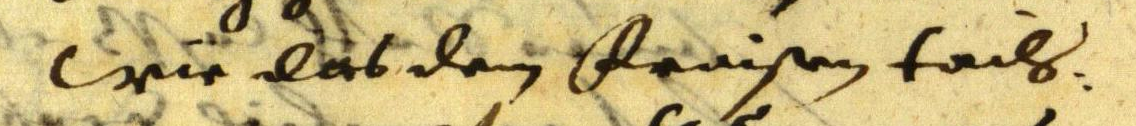wie das dem Fraisen tails¬
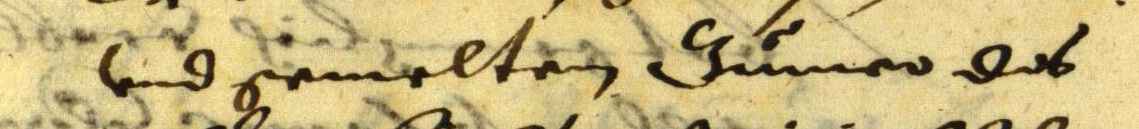vnd gemeltem Gūmer das
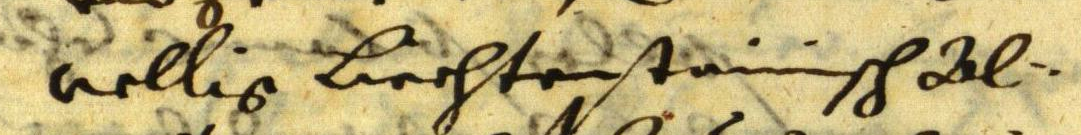vellig Liechtenstainisch Al¬
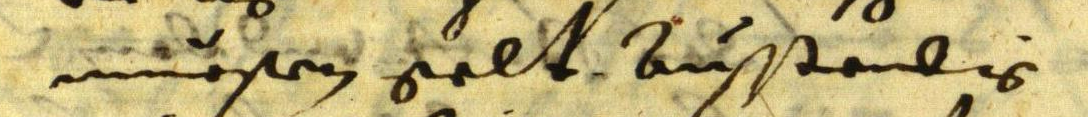mūesen gelt. Aūsstendig
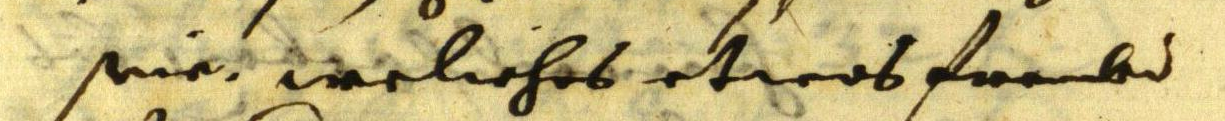seie. weliches etwas frembd
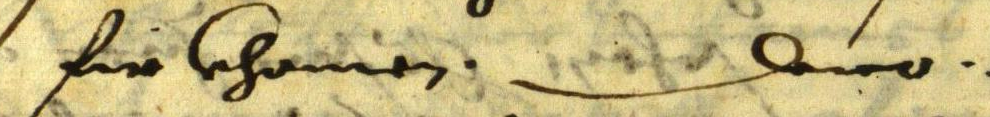fir khomen. Dero¬
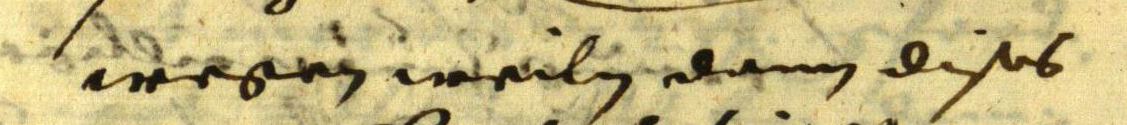wegen weiln dann dises
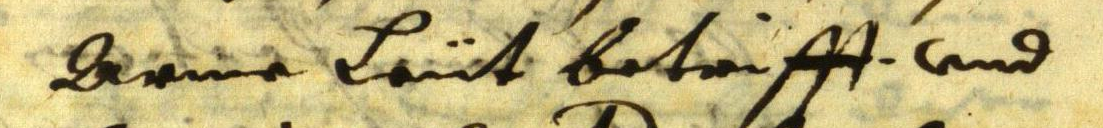Arme Leüt betrifft. vnd
